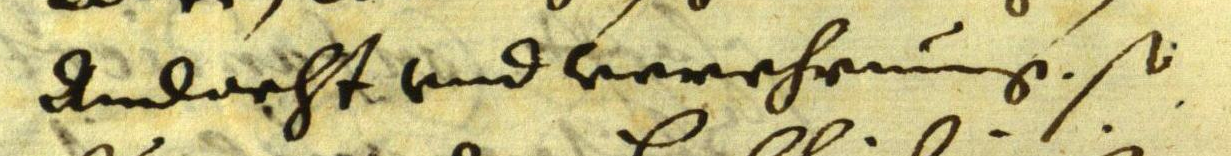Andacht vnd verehrūng. so
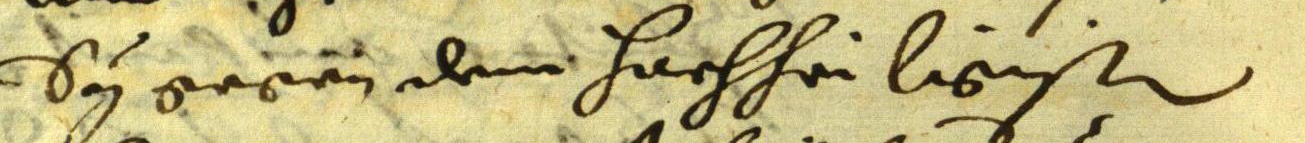Sÿ gegen dem Hochheiligist
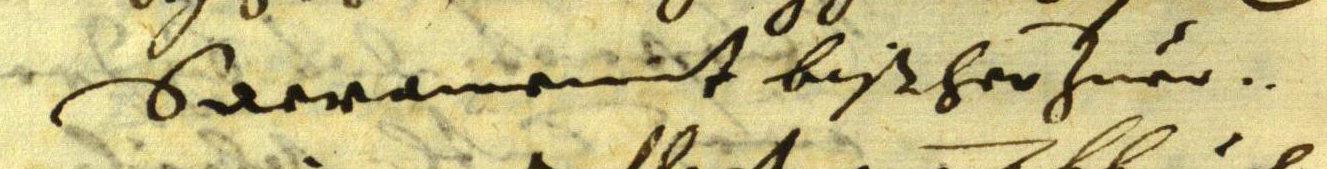Sacramennt bißher Zūer¬
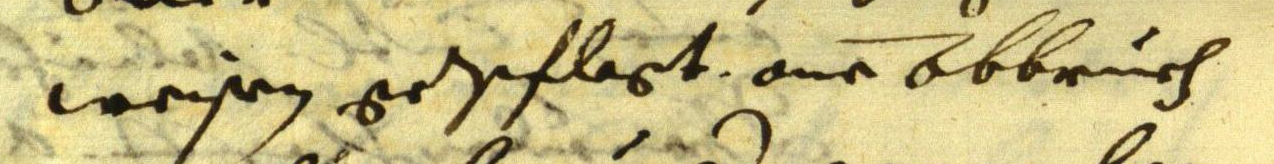weisen gepflegt. one Abbrūch
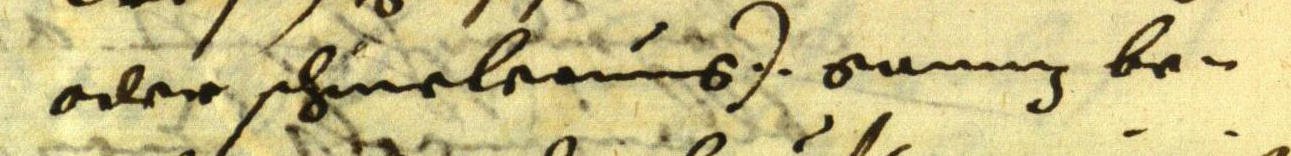oder schmelerūng.). gannz be¬
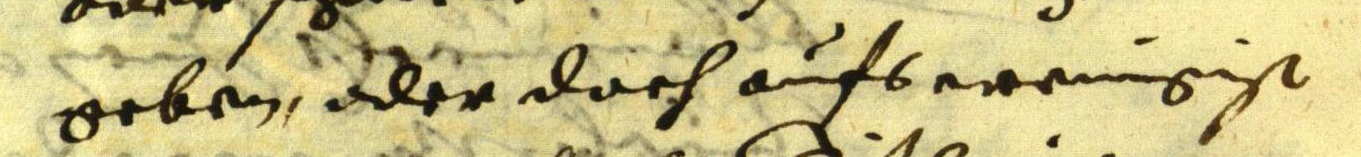geben, oder doch aūfs wenigist
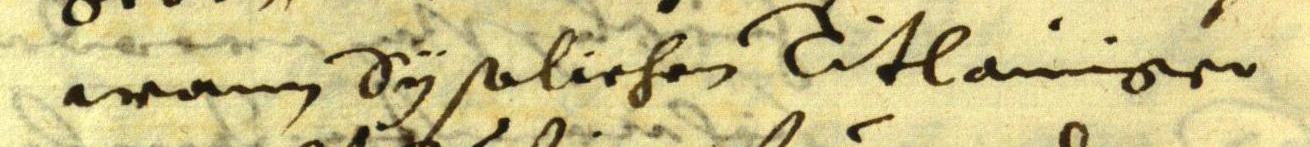wann Sÿ solichen Titl ainiger
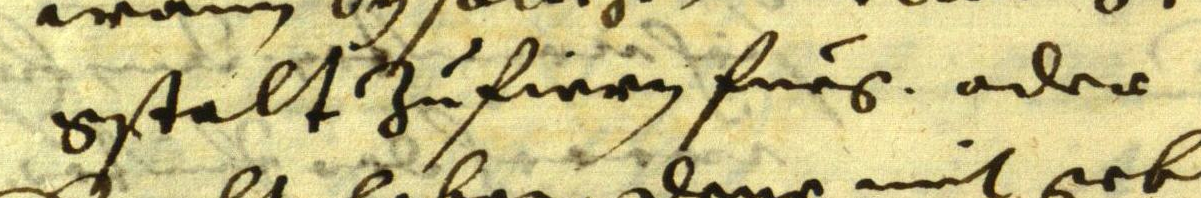gstalt Zū fiern fūeg. oder
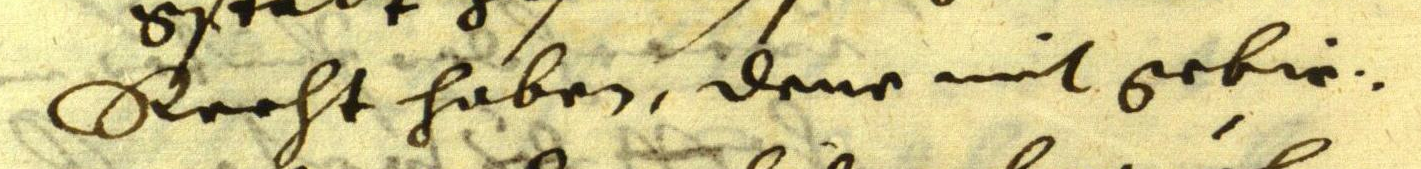Recht haben, dene mit gebir¬
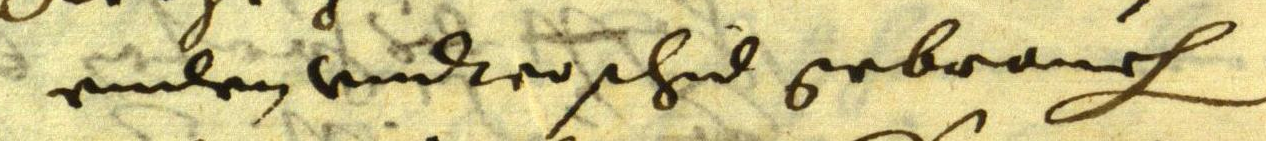enden vnderschid gebraūch
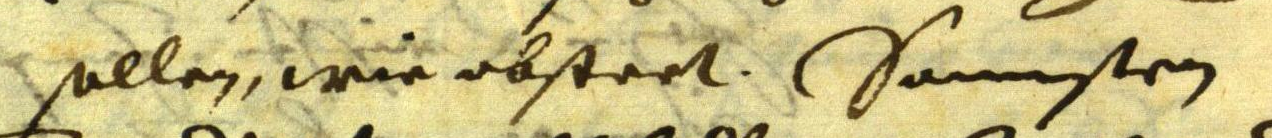sollen, wie obsteet. Sonnsten
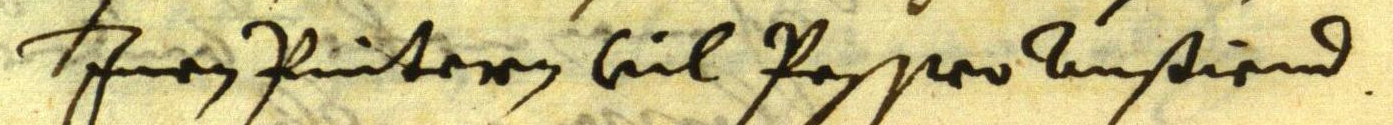Inen Pintern vil Pesser Anstiend.
